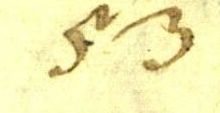53
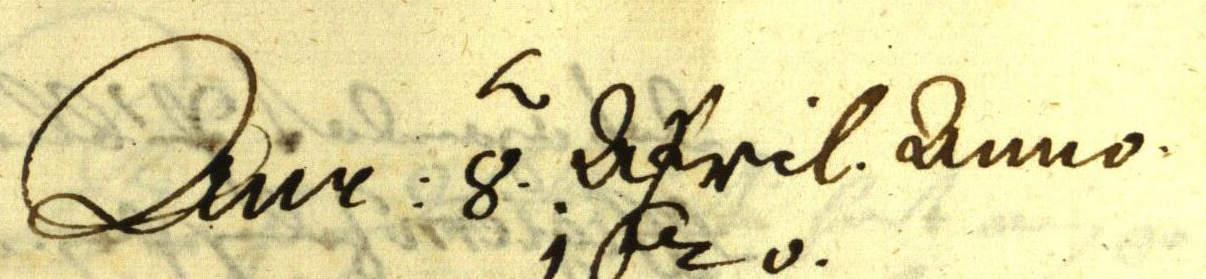Am: 8t. April. Anno.
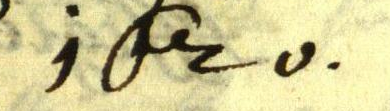1620.
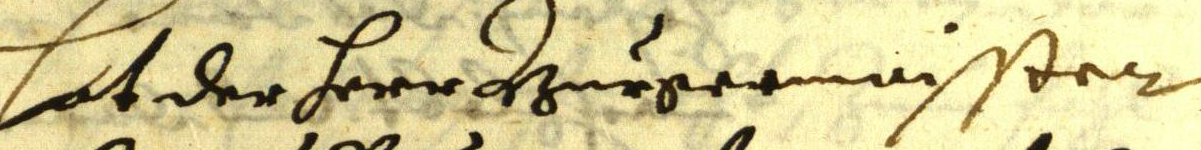hat der herr Būrgermaisster
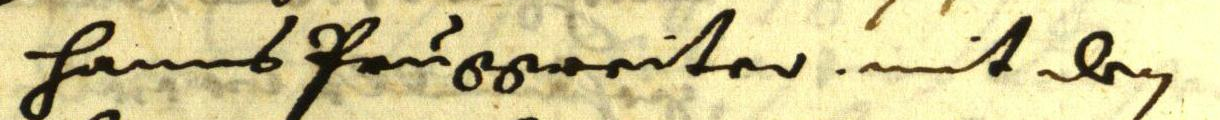hanns Prūggreiter. mit den
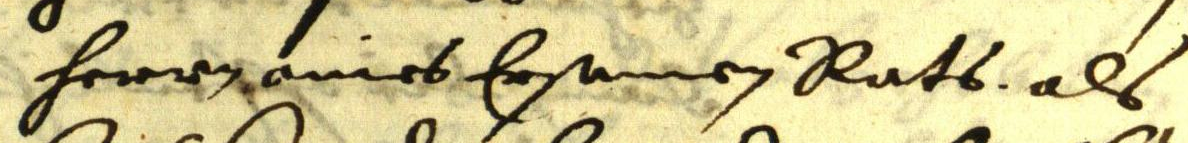herrn aines Ersamen Rats. als
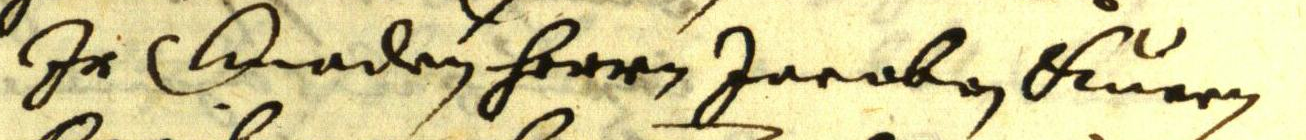Ir Gnaden herrn Jacoben Kūeen
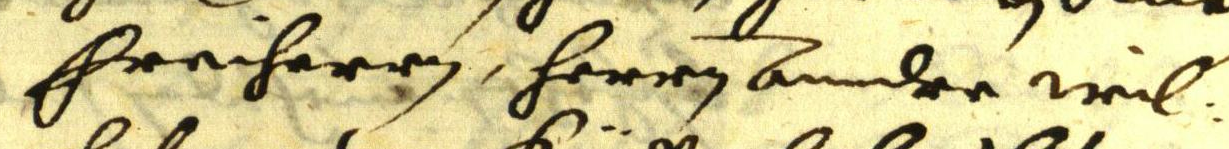Freiherrn, herrn Anndre Wil¬
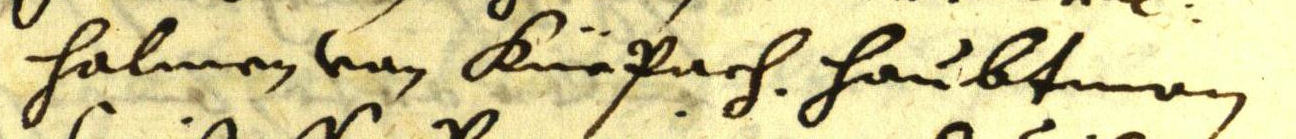halmen von KüePach. haūbtman
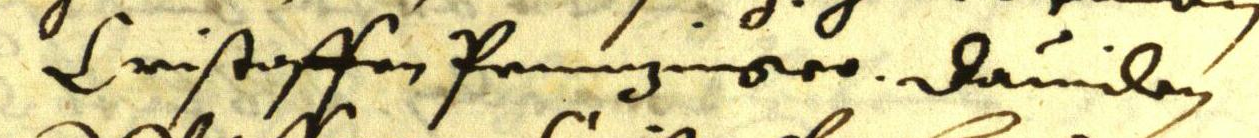Cristoffen Pennzinger. Daūiden
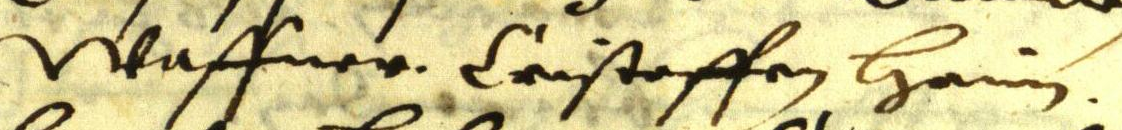Waffner. Cristoffen Haim.
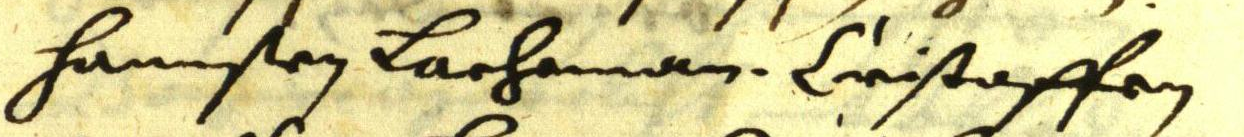hannsen Locheman. Cristoffen
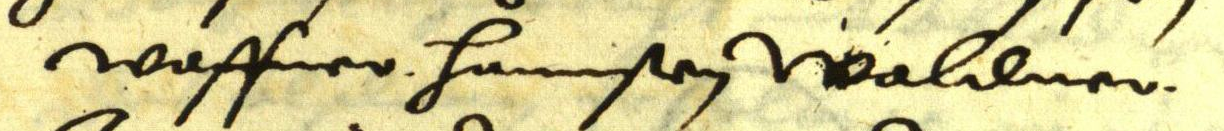Waffner. hannsen Waldner.
